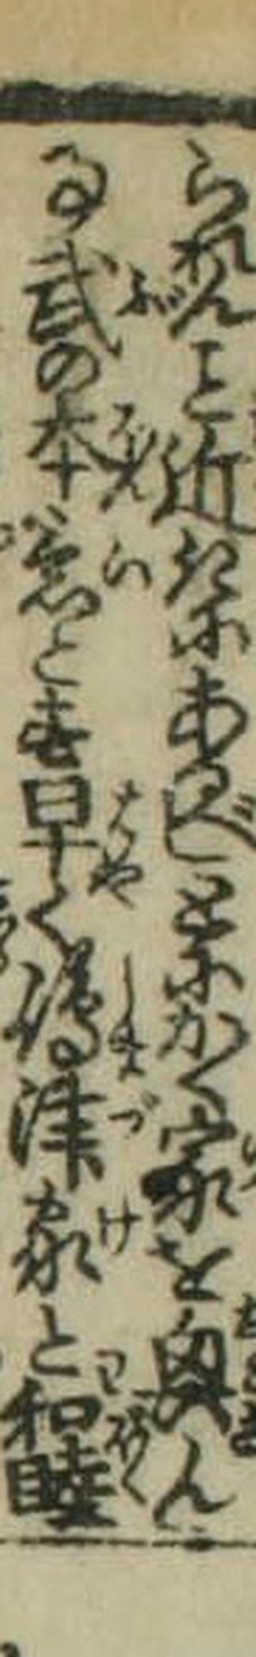事武の本意とす早く嶋津家と和睦
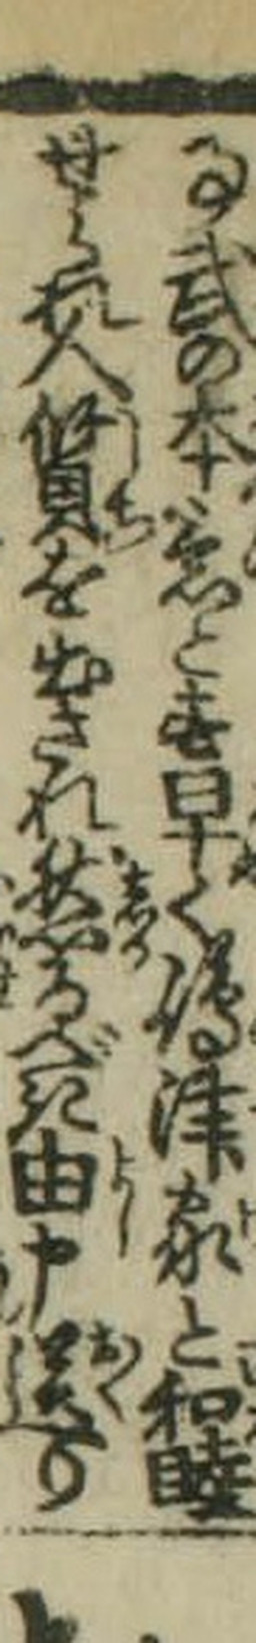せられ人質を出され然るべき由申送り
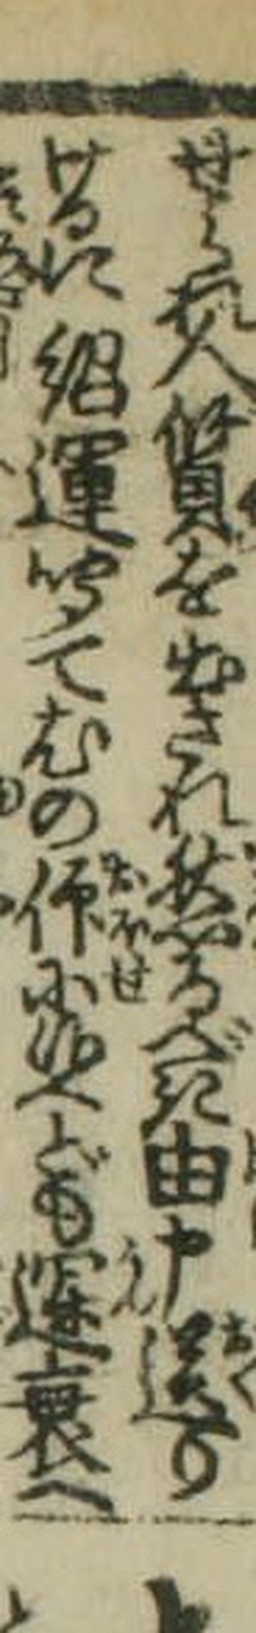けるに紹運聞て尤の仰に候へども運衰へ
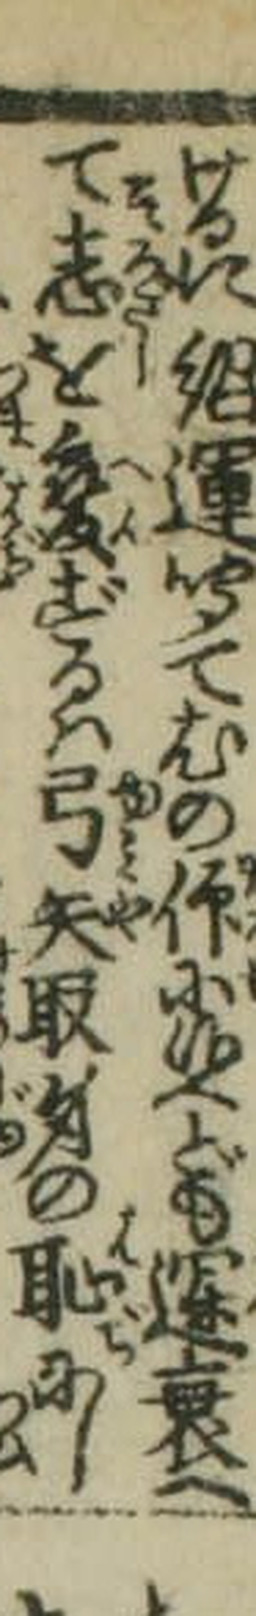て志を変ずるは弓矢取身の恥にし
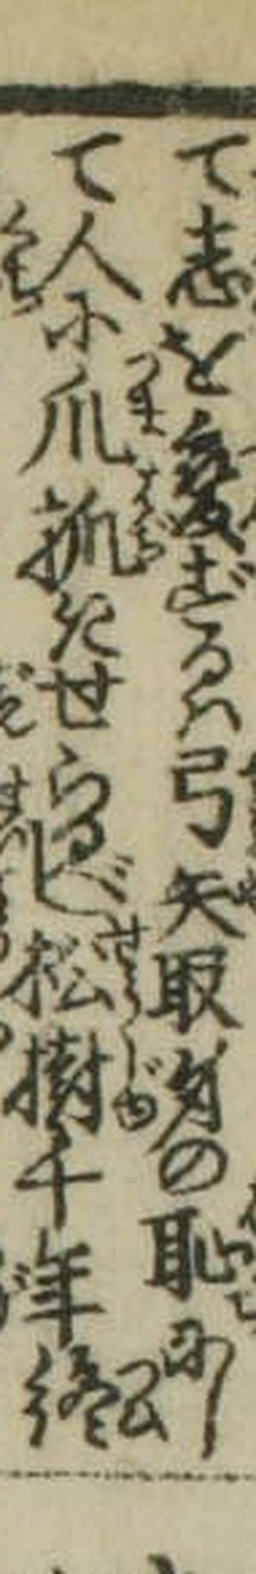て人に爪抓きせらるべし松樹千年終
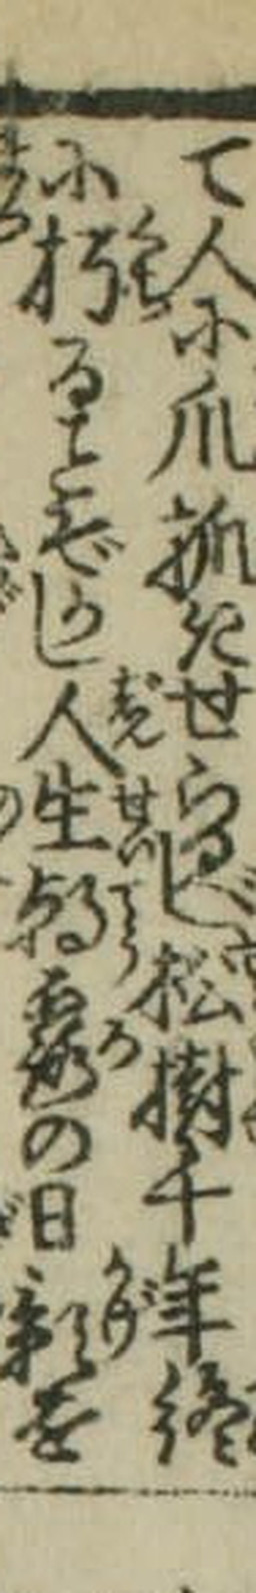に朽ることぞかし人生朝露の日影を
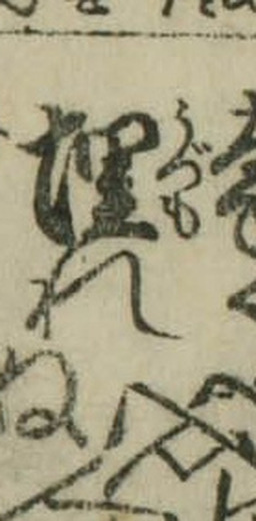埋れぬ
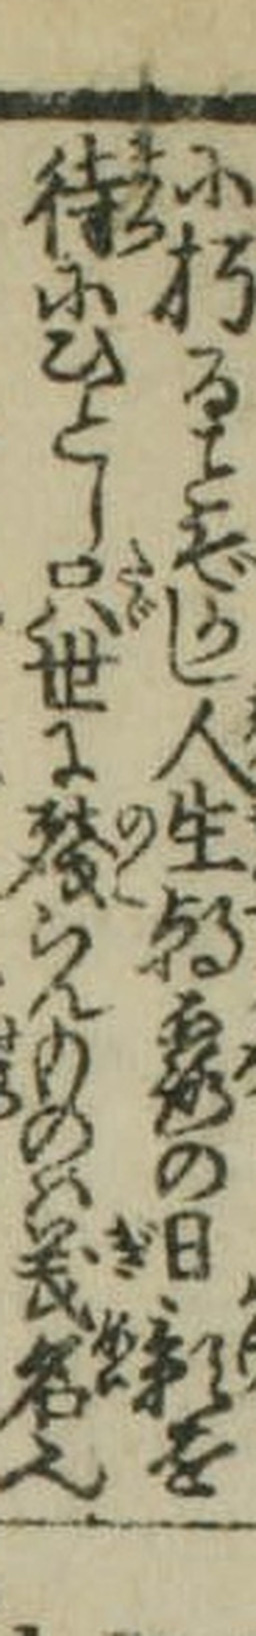待にひとし只世に残らんものは義名也
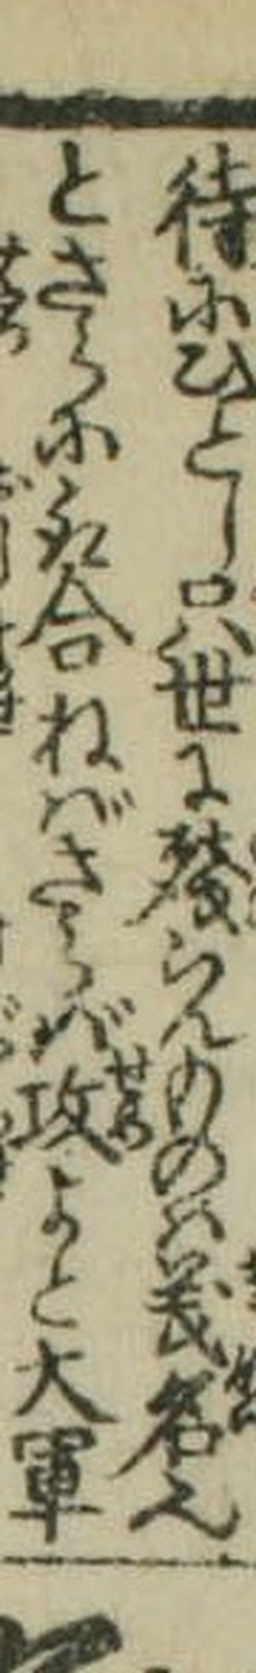とさらに取合ねばさらば攻よと大軍
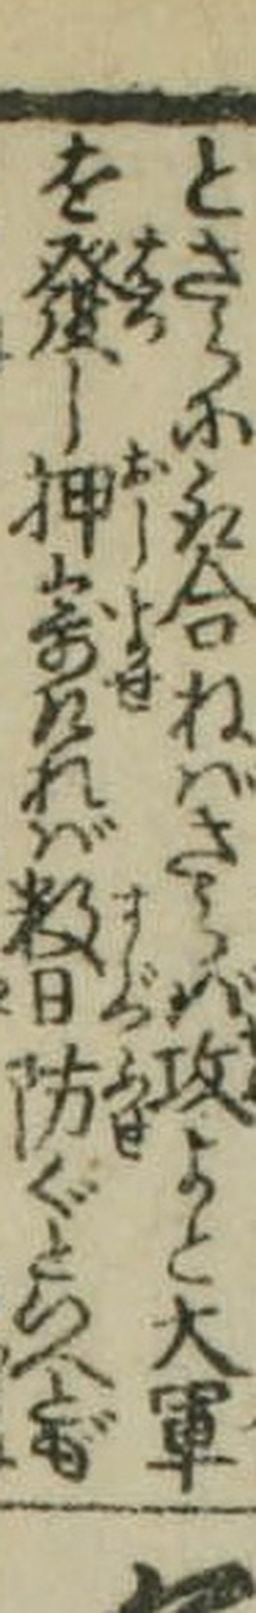を発し押寄ければ数日防ぐといへども
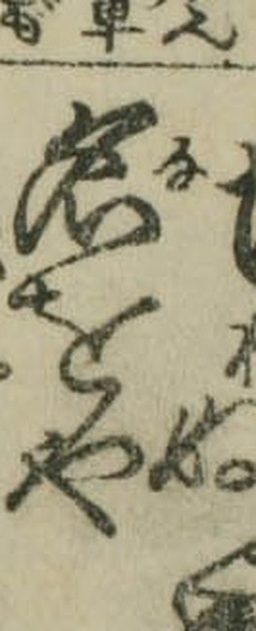名をや
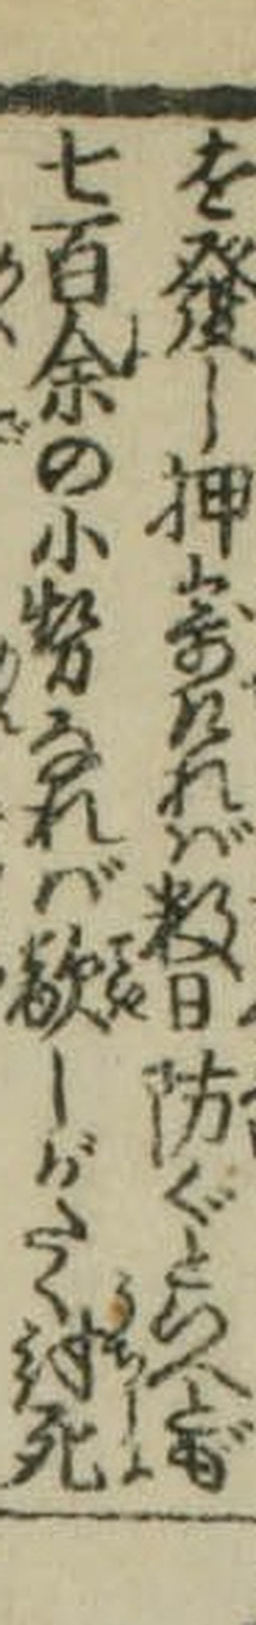七百余の小勢なれば敵しばらく討死
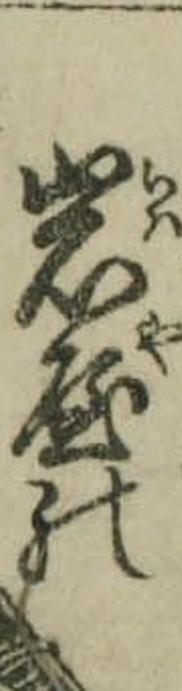岩屋の
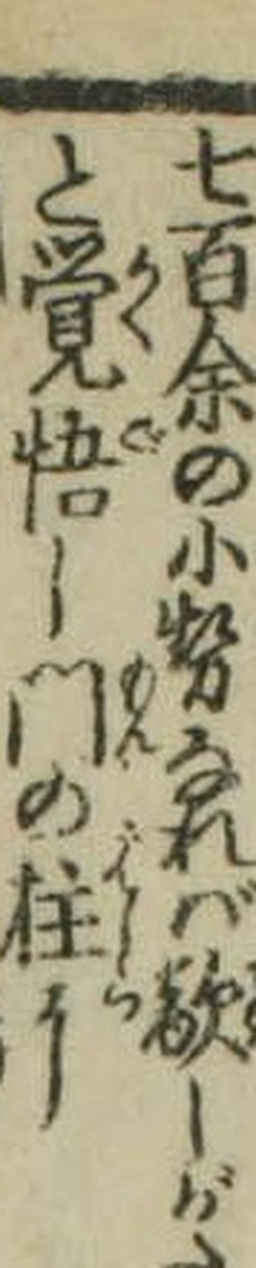と覚悟し門の柱に
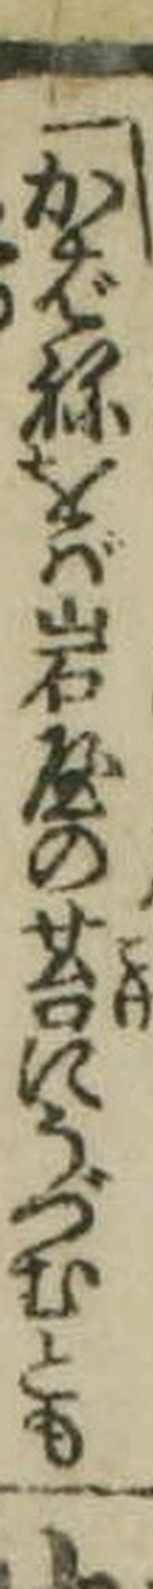〽かばねをば岩屋の苔にうづむとも
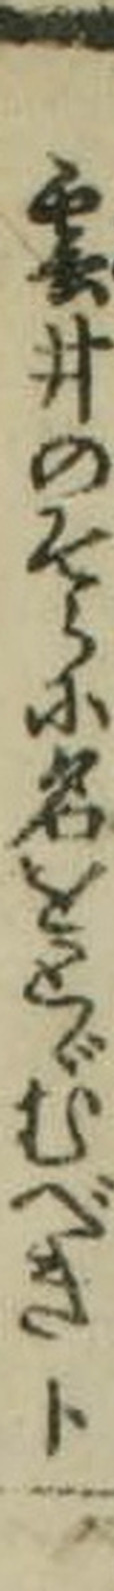雲井のそらに名をとゞむべきト
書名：續英雄百人一首
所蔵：東京学芸大学附属図書館
